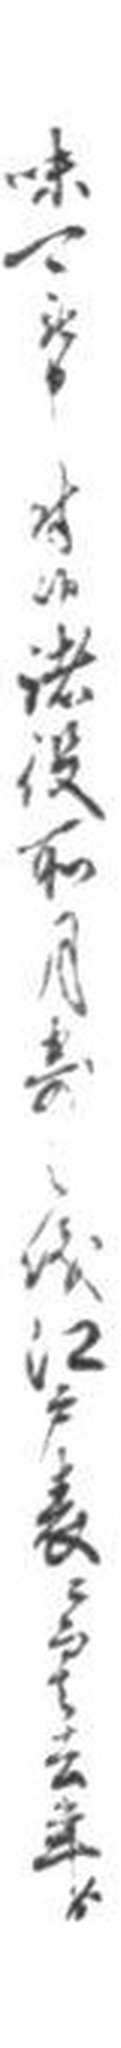味可被申付候諸役所月寄之儀江戸表ニ而者去年ゟ
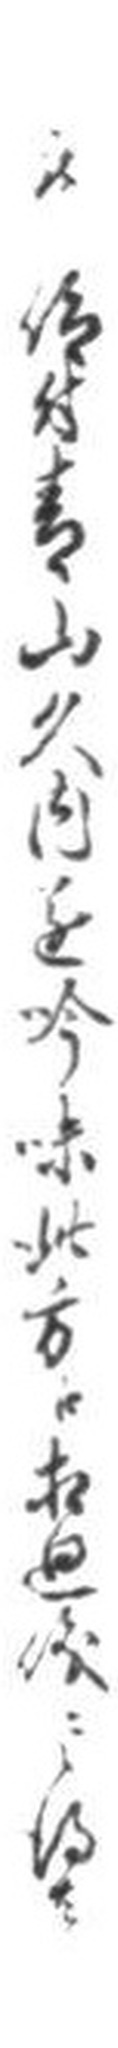被仰付青山久内遂吟味此方江相廻儀ニ候得共
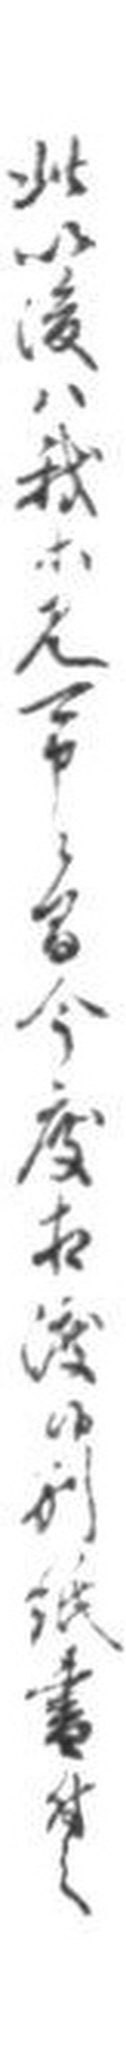此以後ハ我等見可申候間今度相渡候別紙書付之
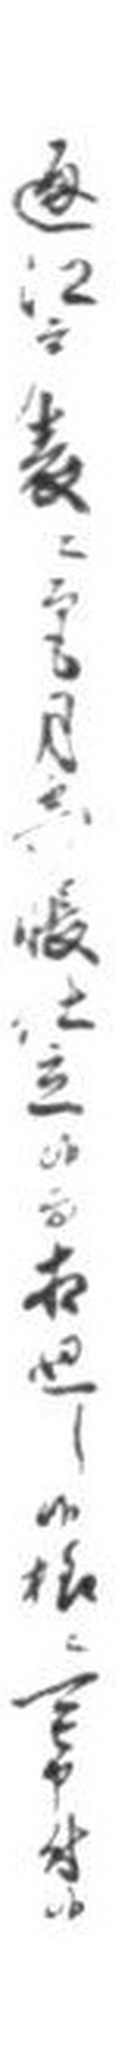通江戸表ニ而も月寄帳仕立候而相廻し候様ニ可被申付候
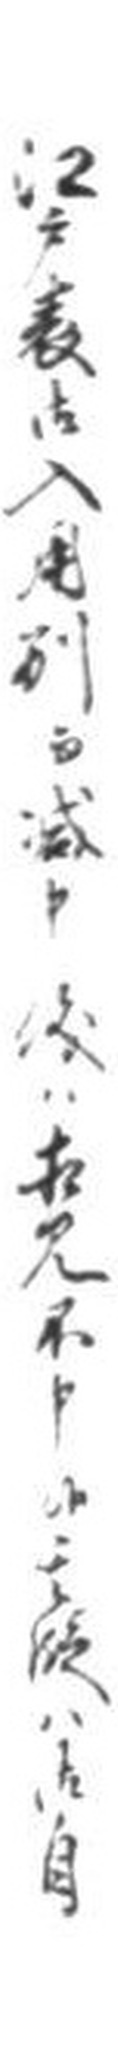江戸表御入用別而減申儀ハ相見不申候其段ハ御自
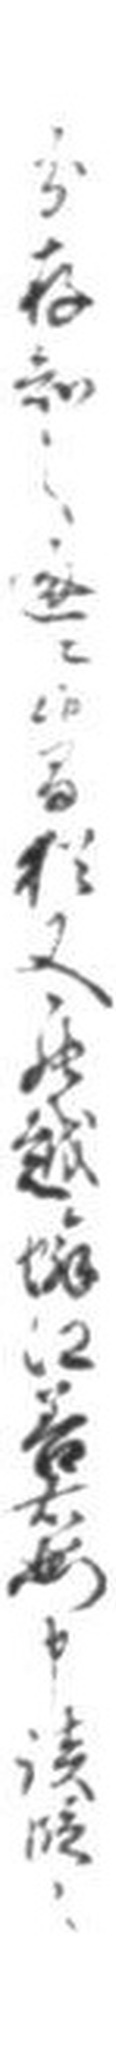分存知之通ニ候間猶又罷越蟹江善右衛門申談段々
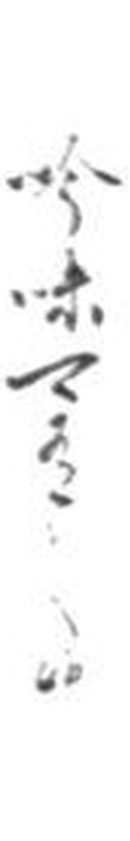吟味可有之候
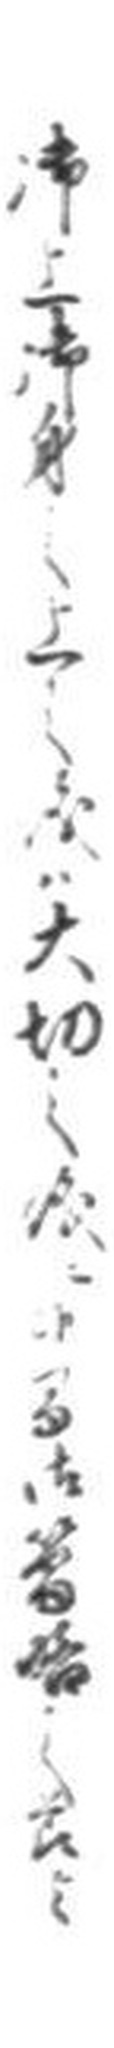御上御身之上之儀ハ大切之儀ニ候間御簡略之節と
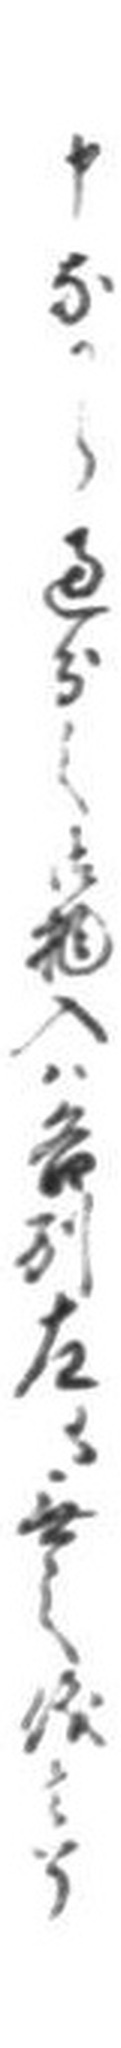申なから過分之御物入ハ各別左も無之儀者了
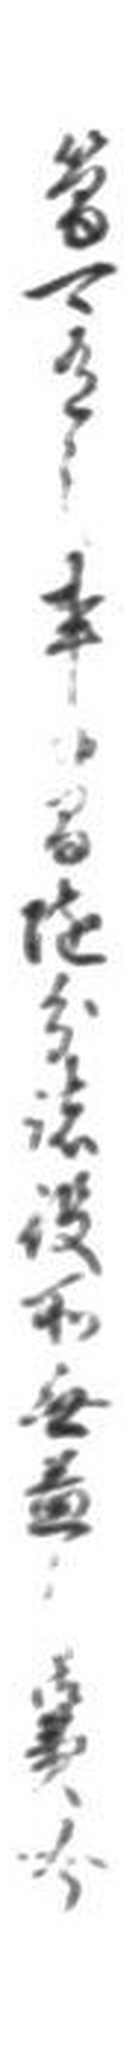簡可有之事候間随分諸役所無益之御費吟
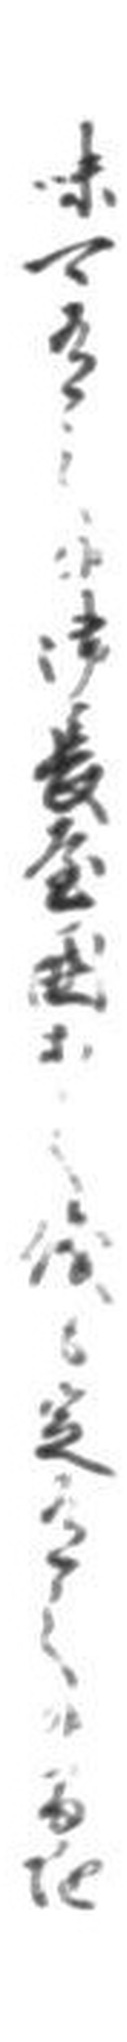味可有之候御長屋囲等之儀も定有之候間随
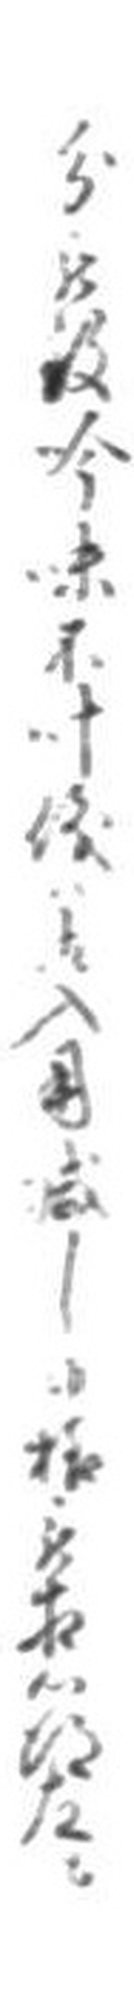分被致吟味不叶儀ハ御入用減し候様被相心得左も
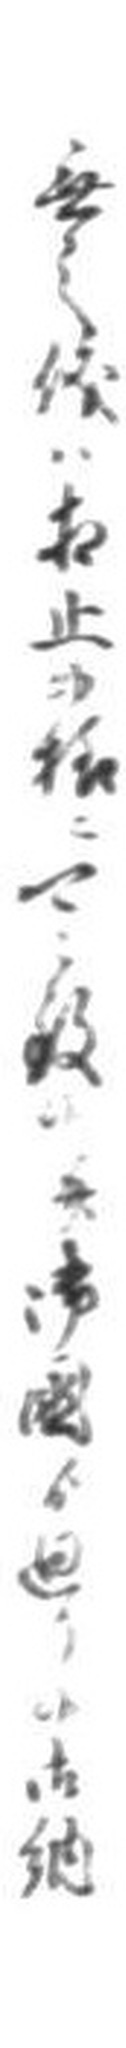無之儀ハ相止候様ニ可被致候幷御国ゟ廻り候御納
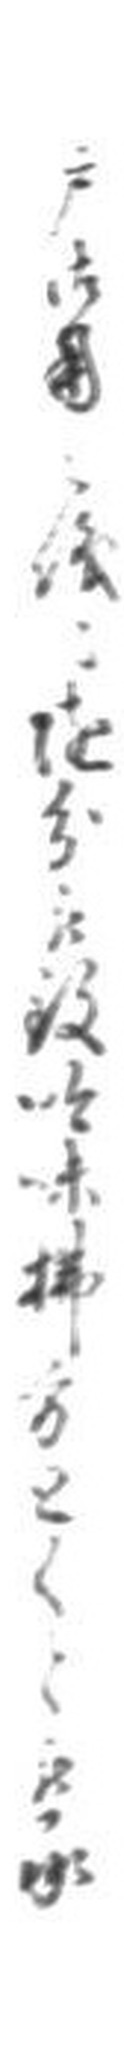戸御用之儀も随分被致吟味払方とくと被承
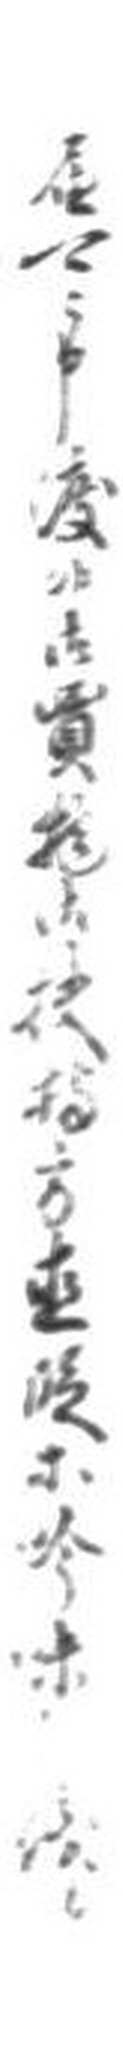届可被申渡候御買物御扶持方直段等吟味之儀も
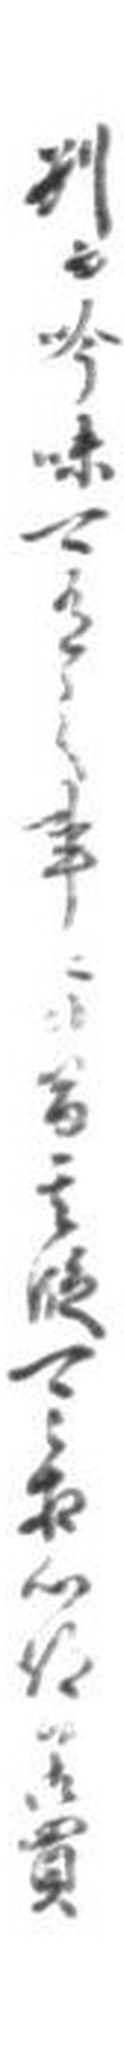別而吟味可有之事ニ候間其段可被相心得候御買
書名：家譜 三十九 宗矩公 享保十年
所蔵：福井県文書館 Fukui Prefectural Archives
